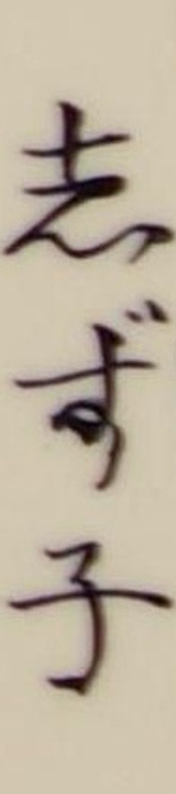しず子
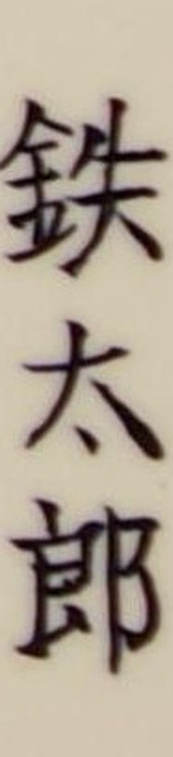鉄太郎
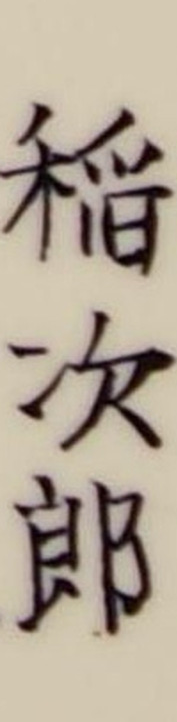稲次郎
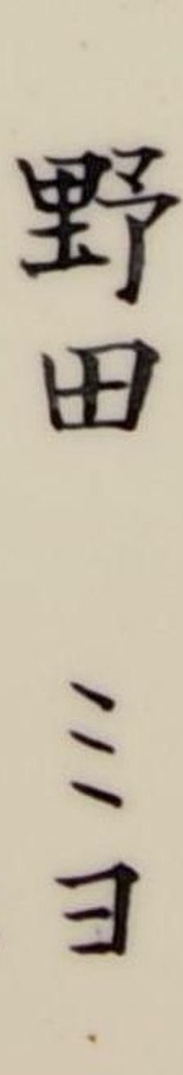野田ミヨ
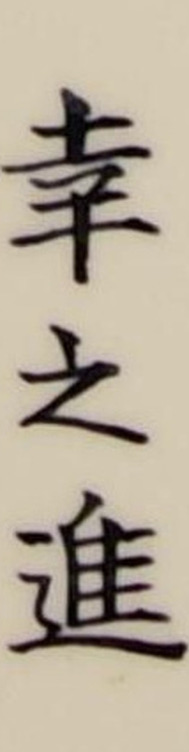幸之進
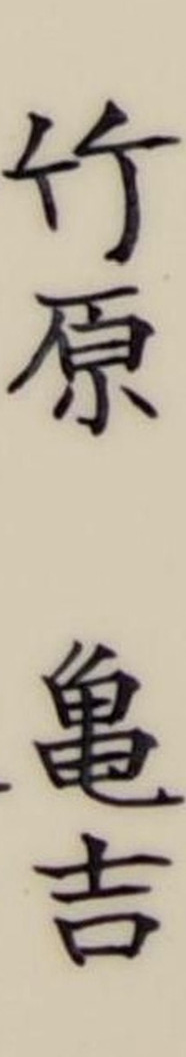竹原亀吉
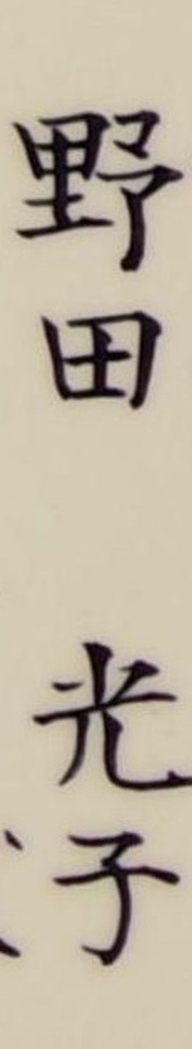野田光子
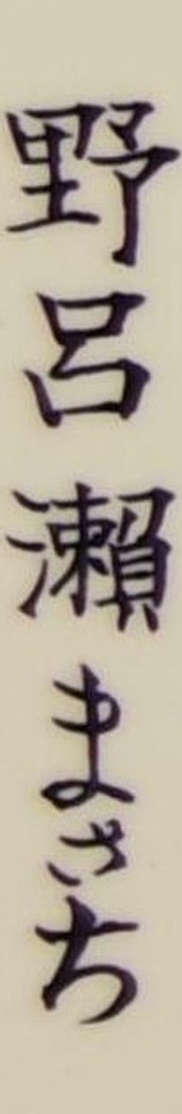野呂瀬まさち
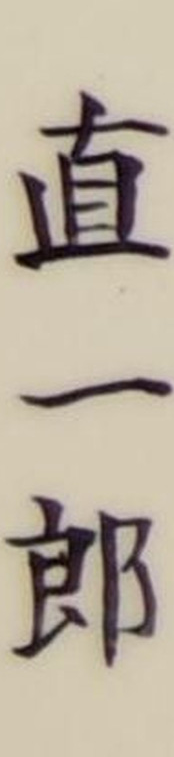直一郎

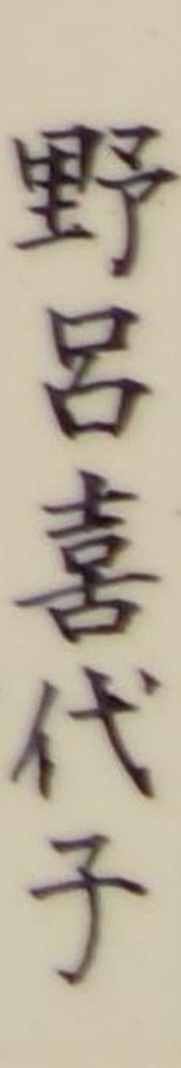野呂喜代子
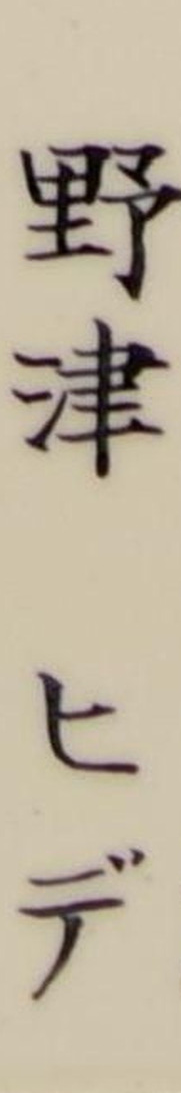野津ヒデ
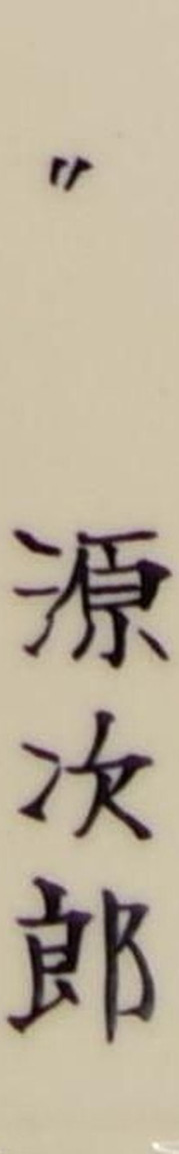源次郎
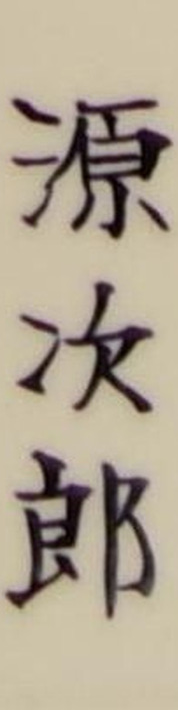源次郎
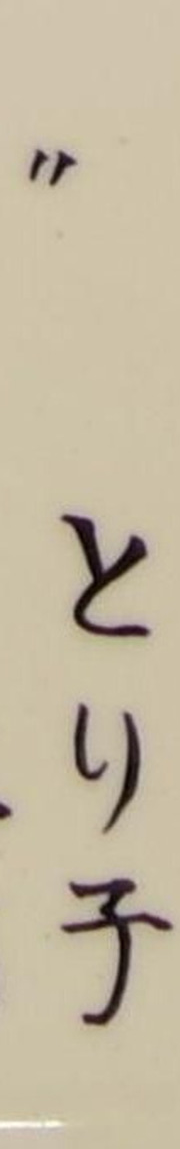とり子
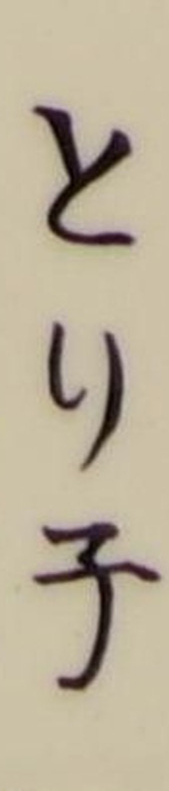とり子
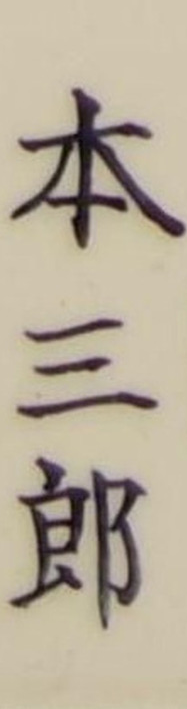本三郎
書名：A~D
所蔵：koyasan kongobuji
